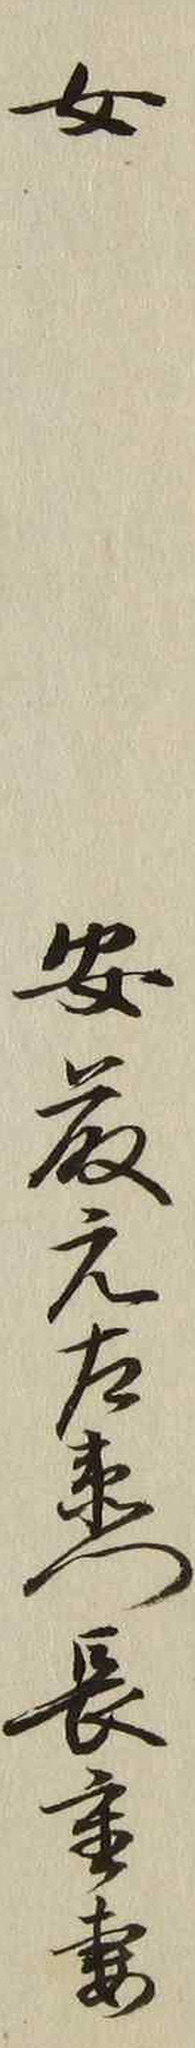女安藤元左衛門長重妻
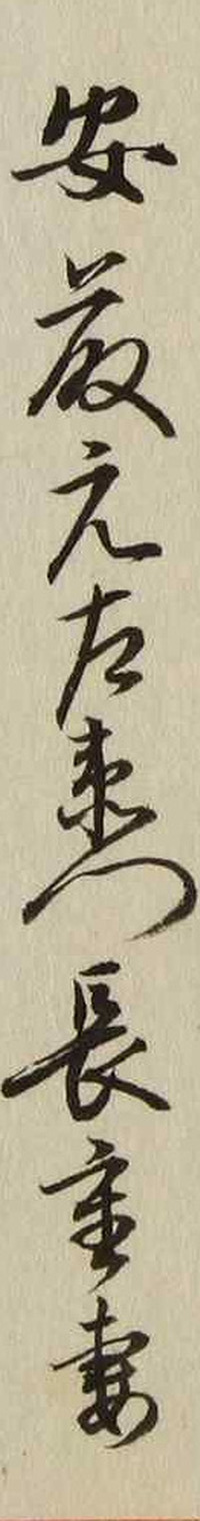女安藤元左衛門長重妻
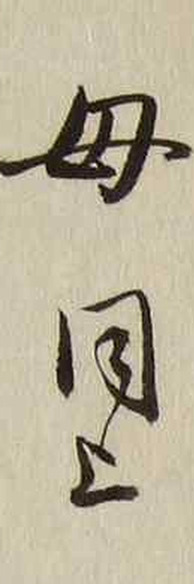母同上
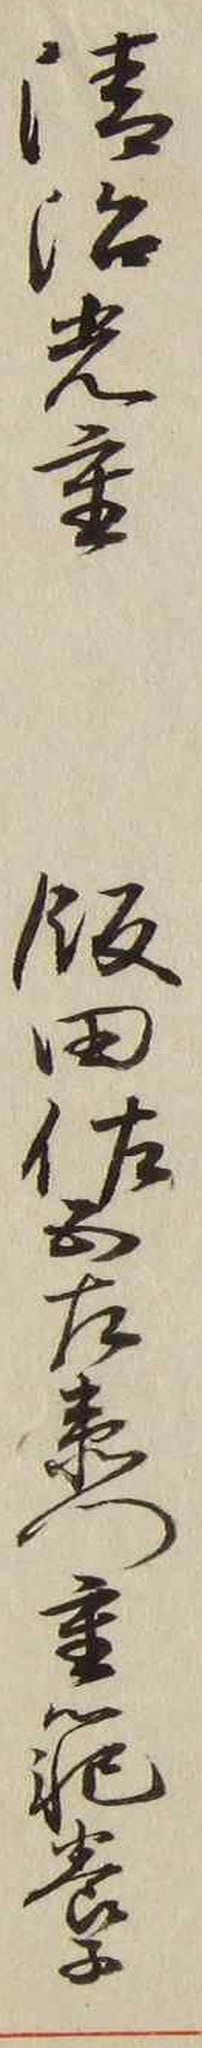清治光重飯田佐五左衛門重範養子

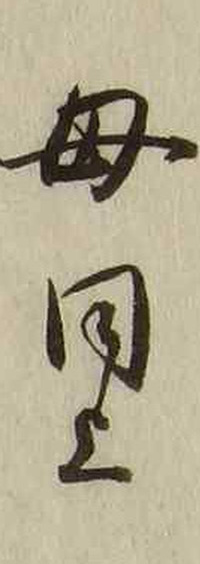母同上
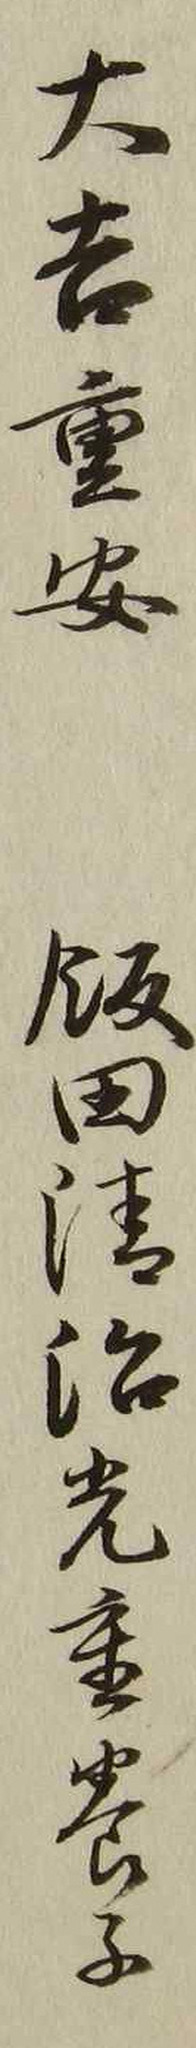大吉重安飯田清治光重養子
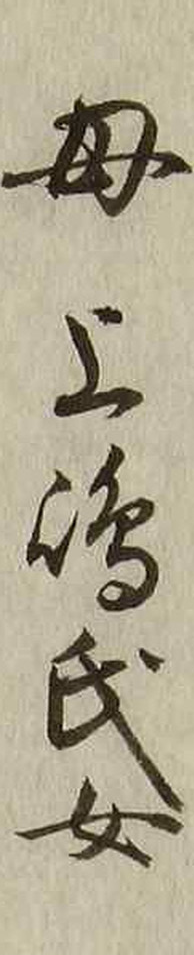母上嶋氏女
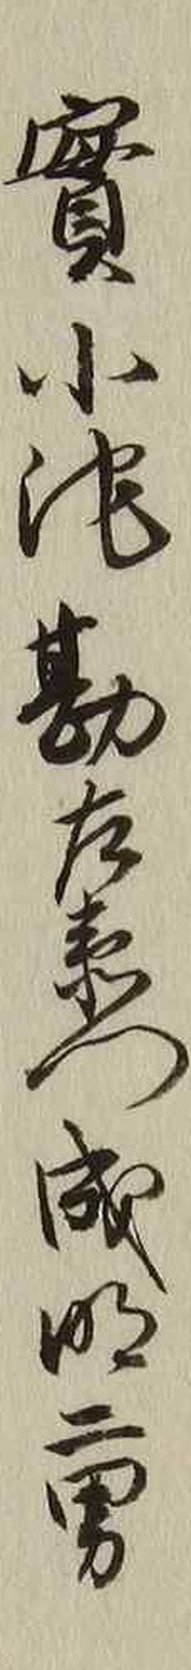実小池勘左衛門成明二男
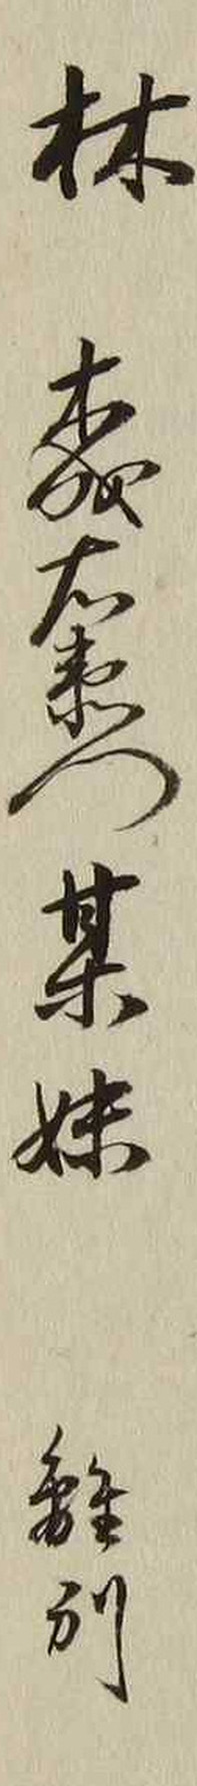林森右衛門某妹離別
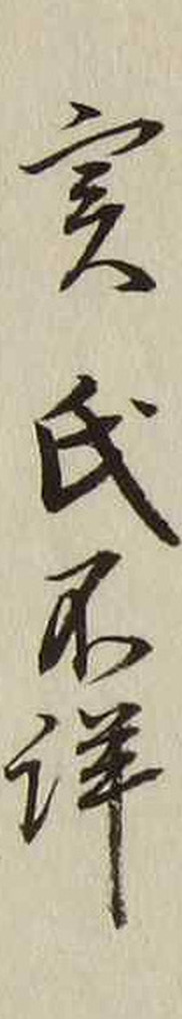実氏不詳
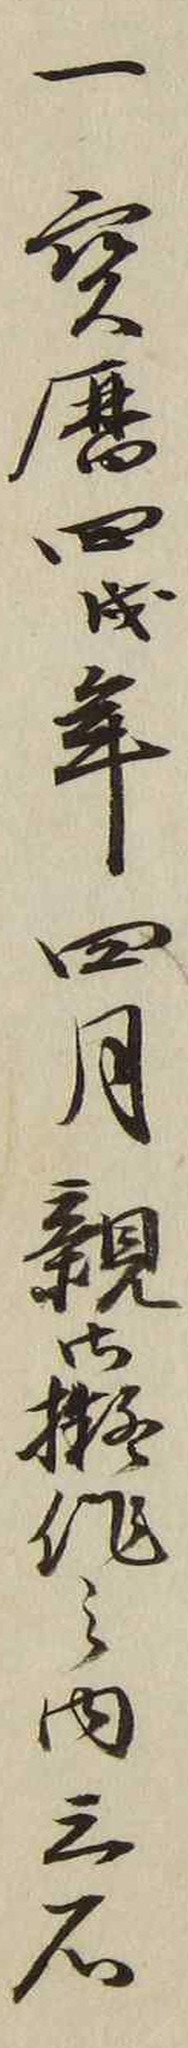一宝暦四戌年四月親御擬作之内三石

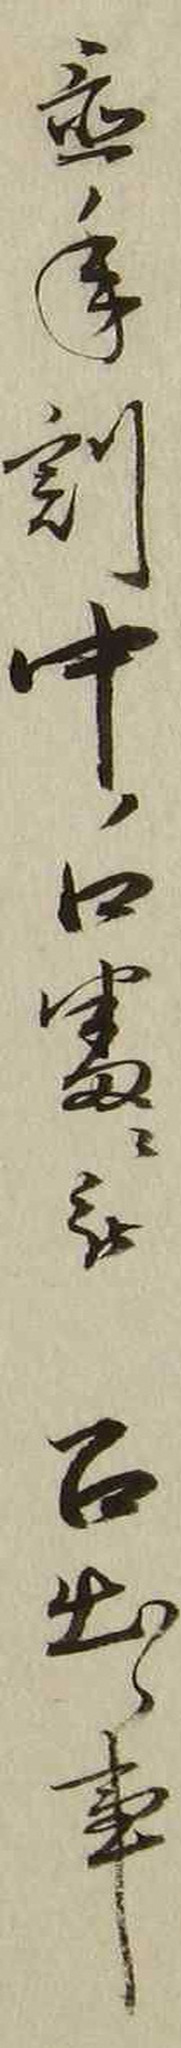置年割中ノ口番被召出候事
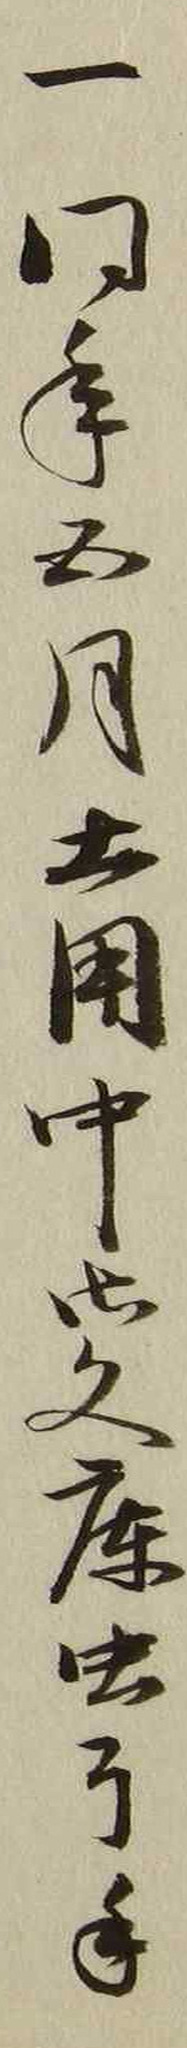一同年五月土用中御文庫虫干手
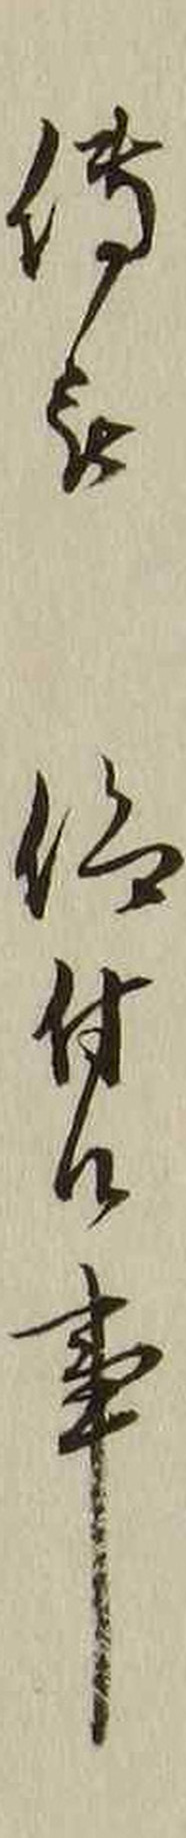伝被仰付候事
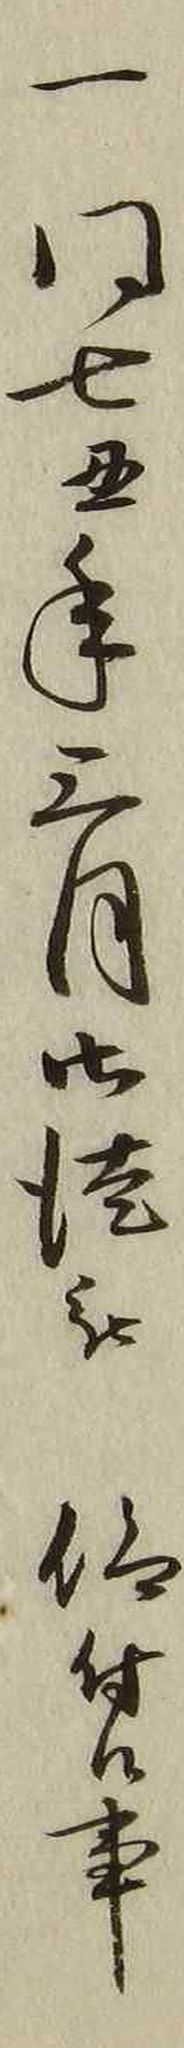一同七丑年三月御徒被仰付候事
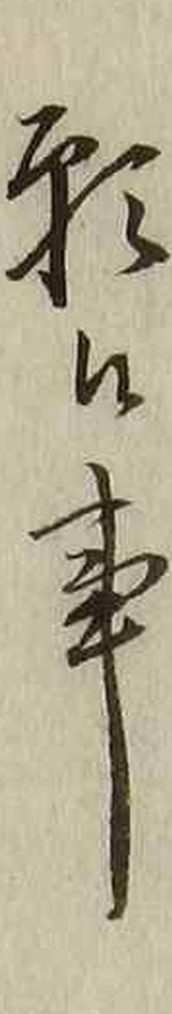願候事
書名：諸士系譜　巻之102　か之部10
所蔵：会津若松市立会津図書館
